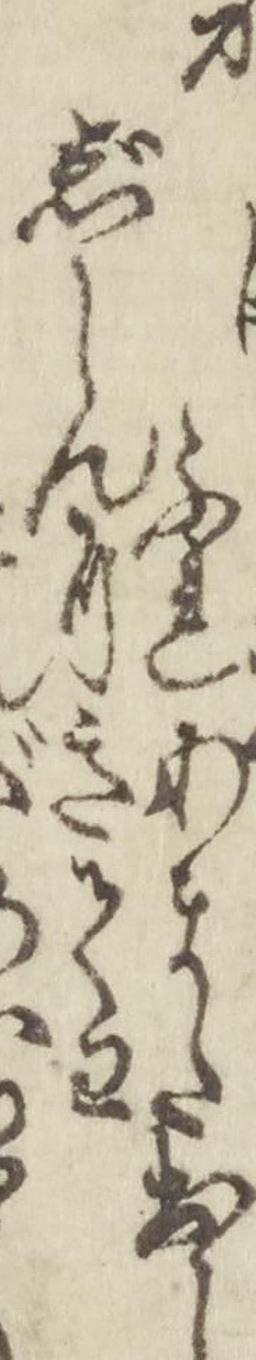じしんにきてわ
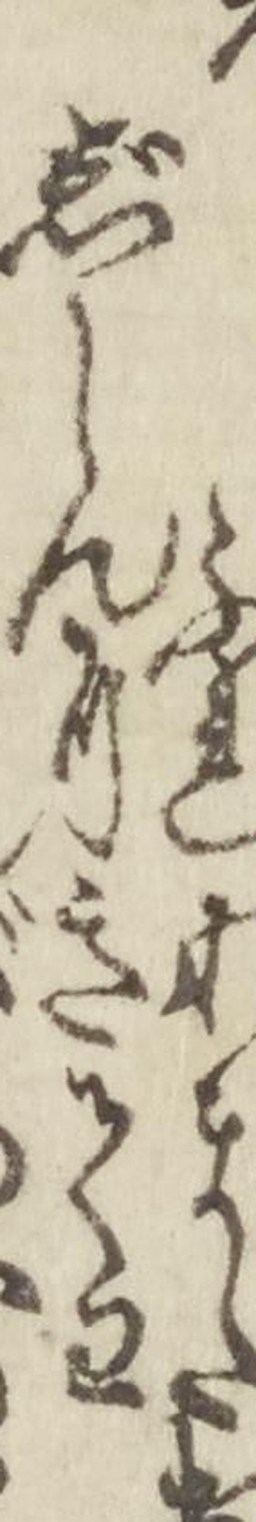じしんにきてわ
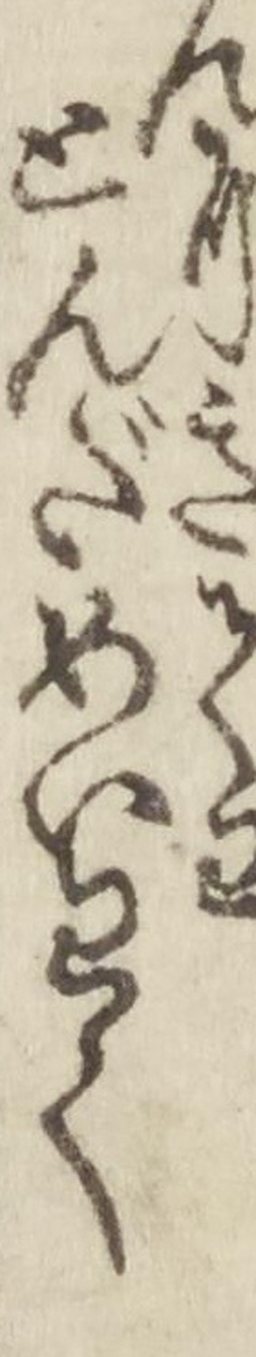とんだめいわく
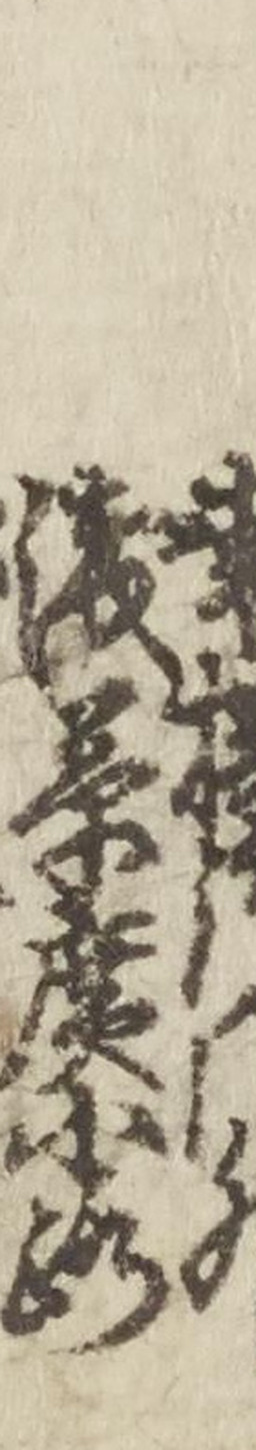浅草広小路
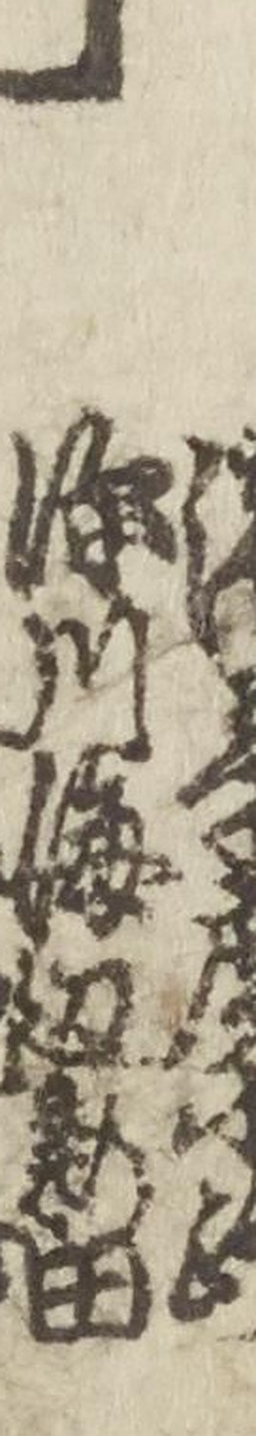深川海辺新田
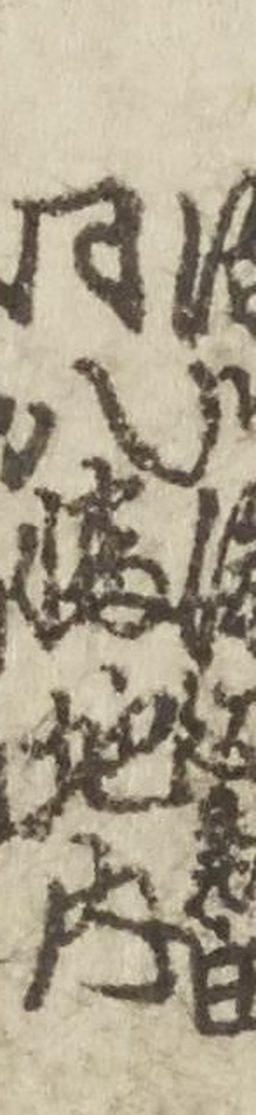同八幡地内
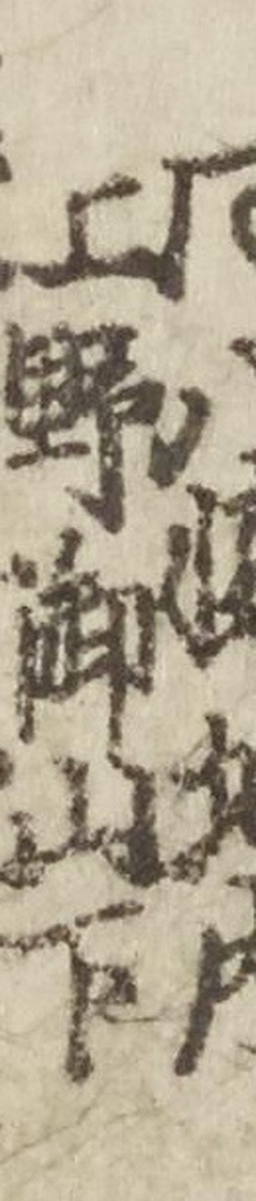上野御山下
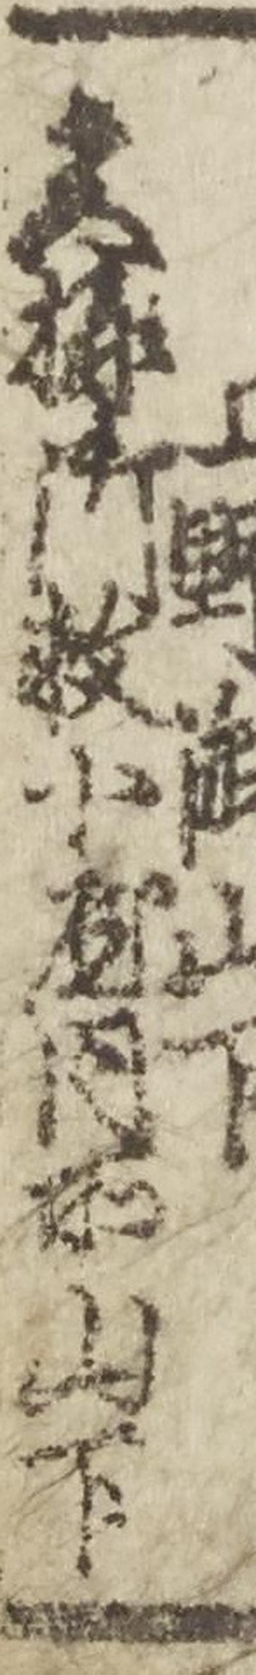宮様御救小屋内所山下

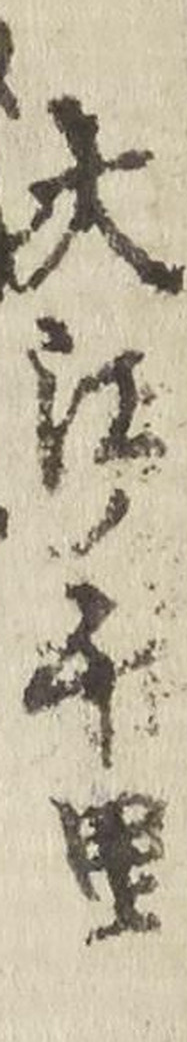大江ノ千里
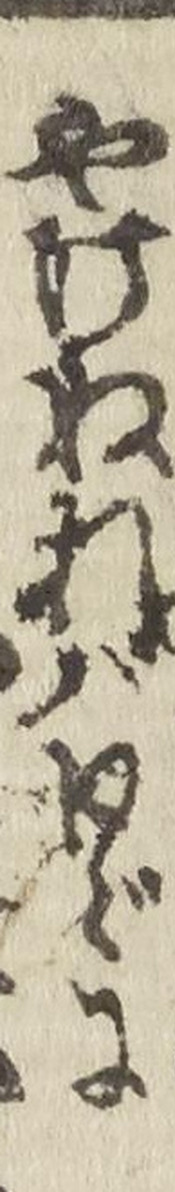やけぬれば日々に
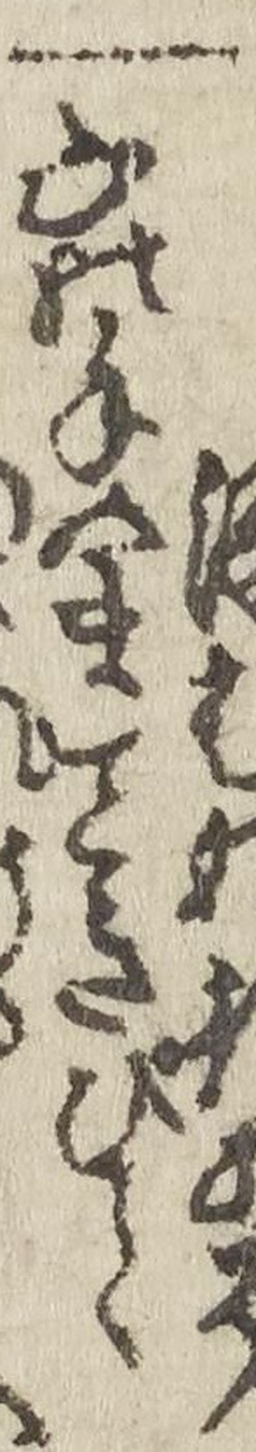山の手はまこときびしく
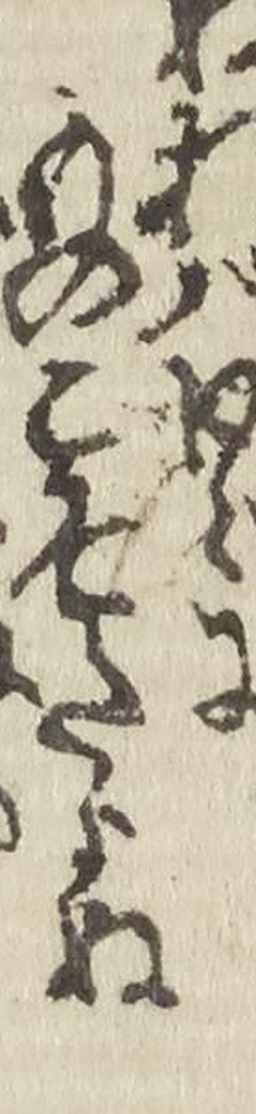ものこそたらぬ
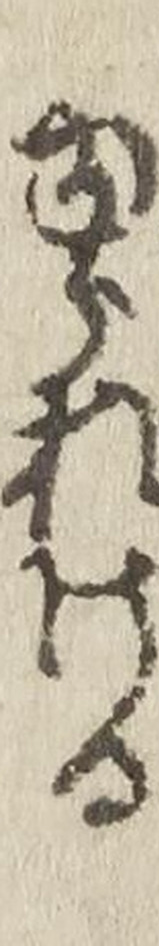ゆられける
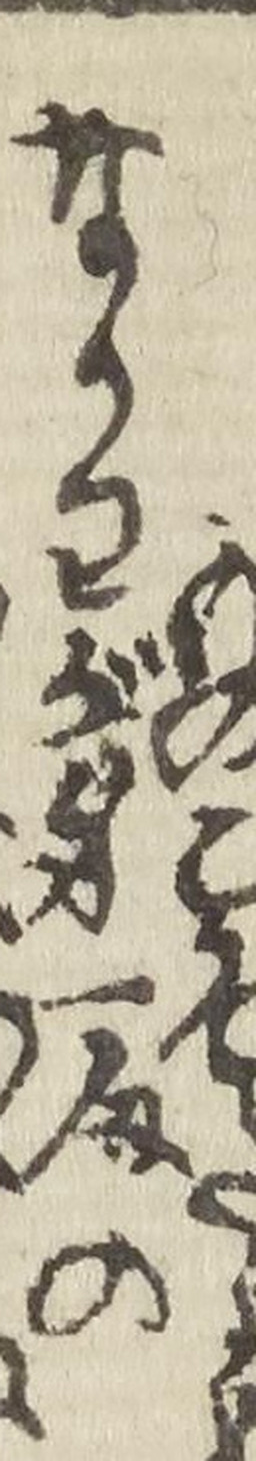なりわが身一人の
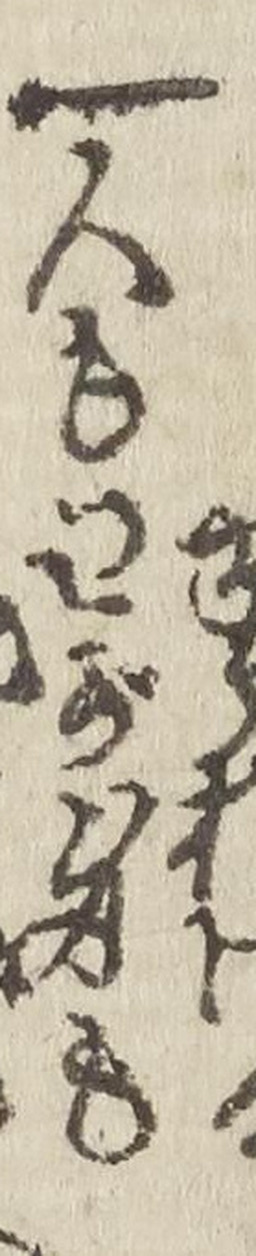人もわが身も
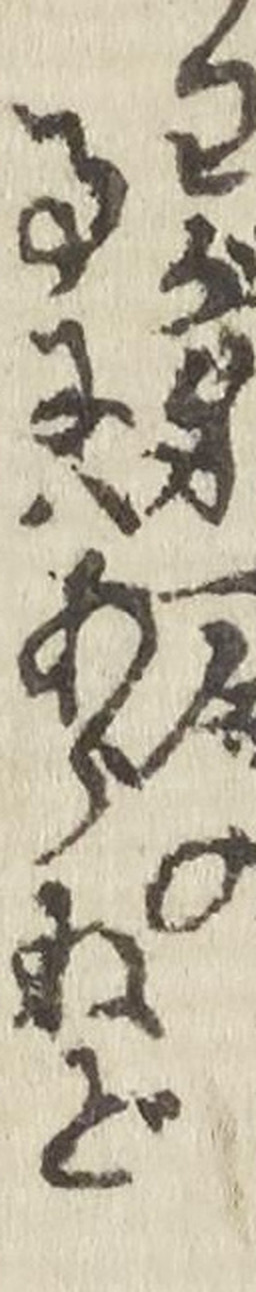事にはあらねど
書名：しんぱん三十六哥仙
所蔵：東京大学地震研究所図書室 Earthquake Research Institute Library, The University of Tokyo, JAPAN
